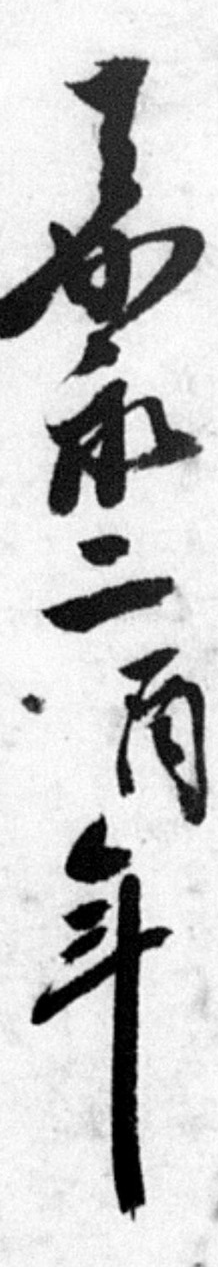嘉永二酉年
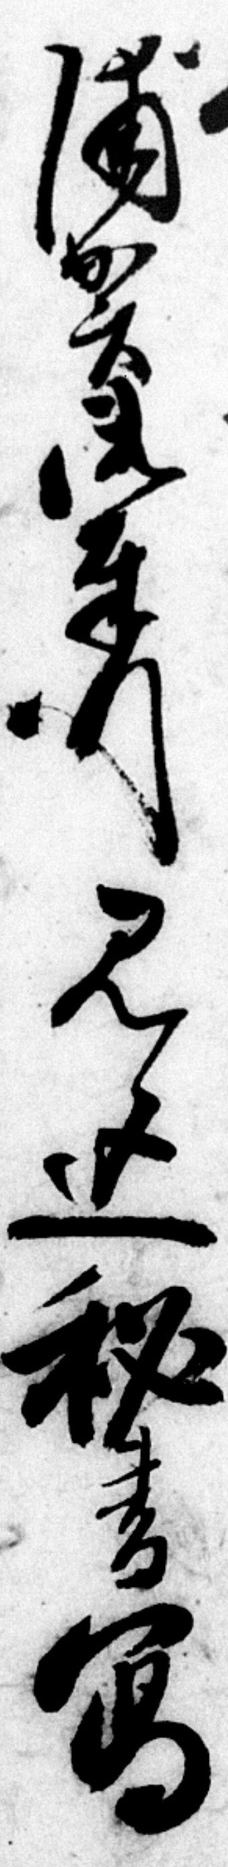浦賀御奉行見込秘書写

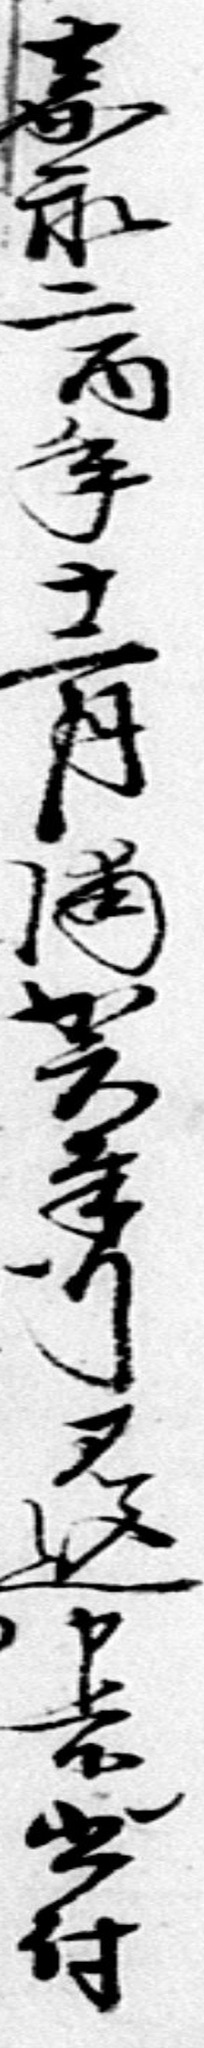嘉永二酉年十二月浦賀奉行見込申上候書付
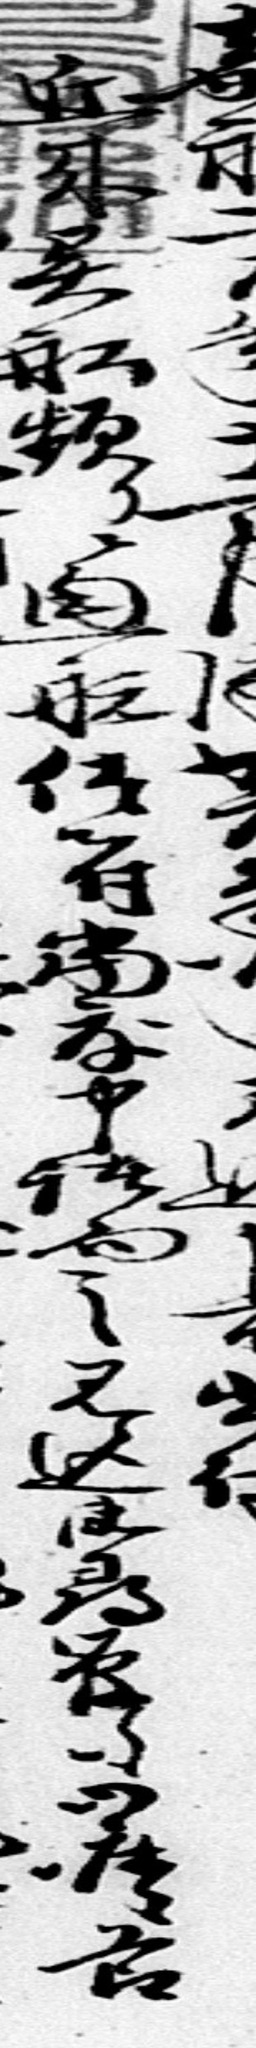近来異船頻りに通船仕候に付当度中諸向之見込御尋簡も御座候節
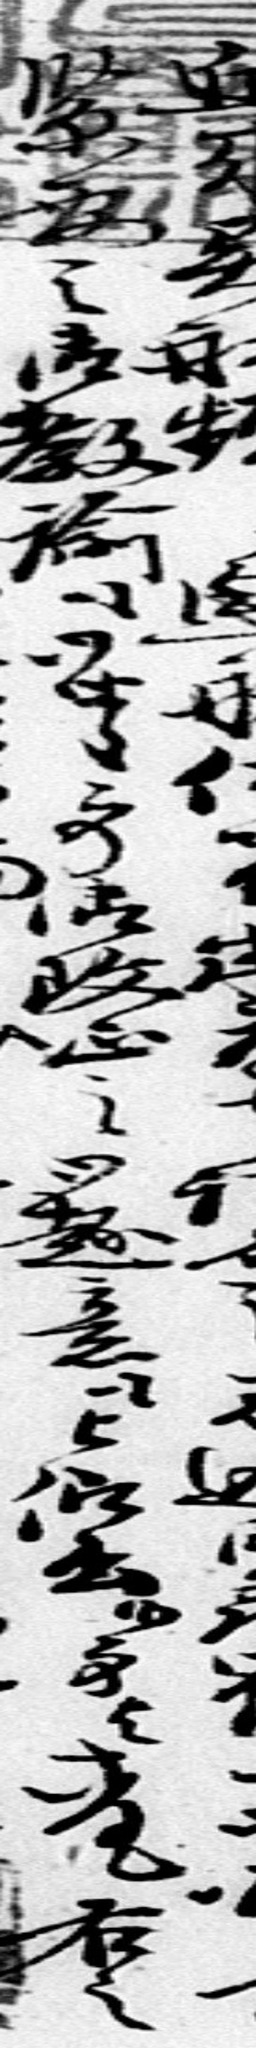緊要之御教諭も御座候事御改正之御趣意も被仰出候事と奉存候右之
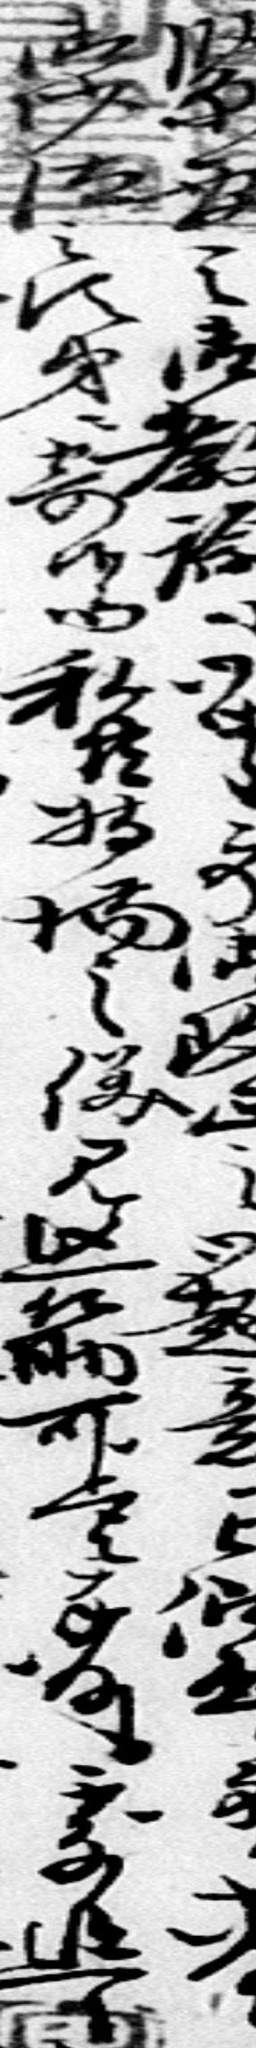御沙汰之次第に寄候而私共持場之儀見込筋可申上と奉存候其外追而
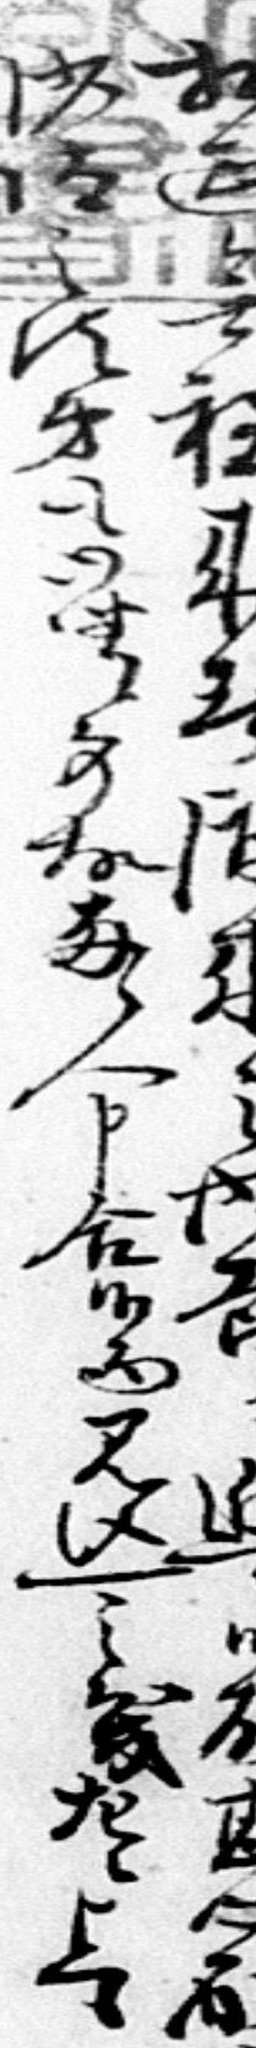沙汰之次第も御座候事故両人申合候而見込之義左に申上候
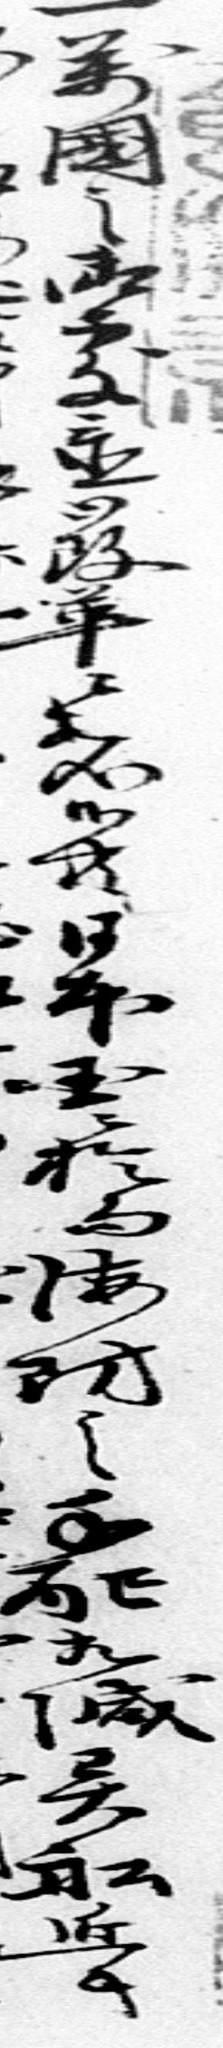一万国之御処置御改革に相成候共日本国に於而海防之手配相減異船近き
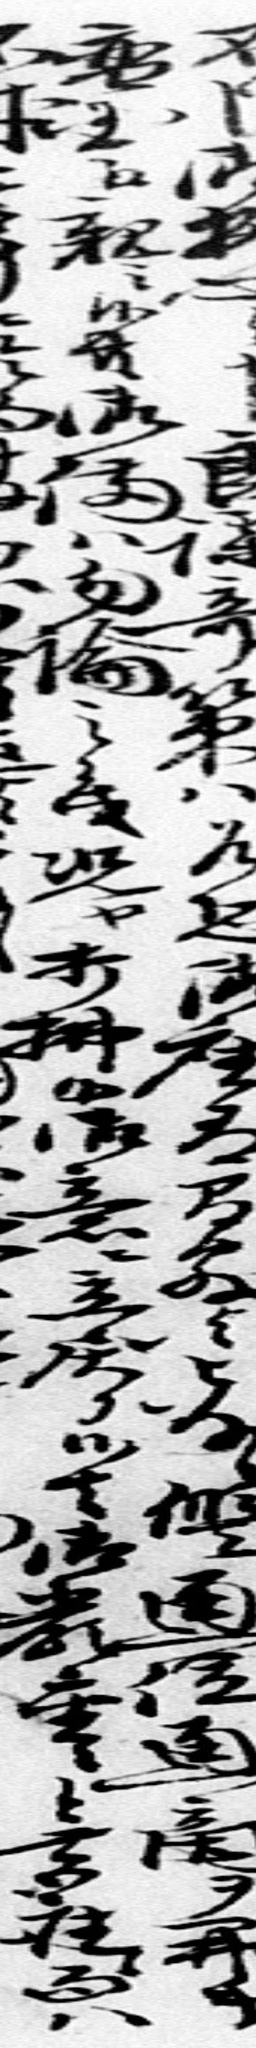蛮国江親み候共御備は勿論之義況や打払候御意に立戻リ候者御厳重にと無御座候而は
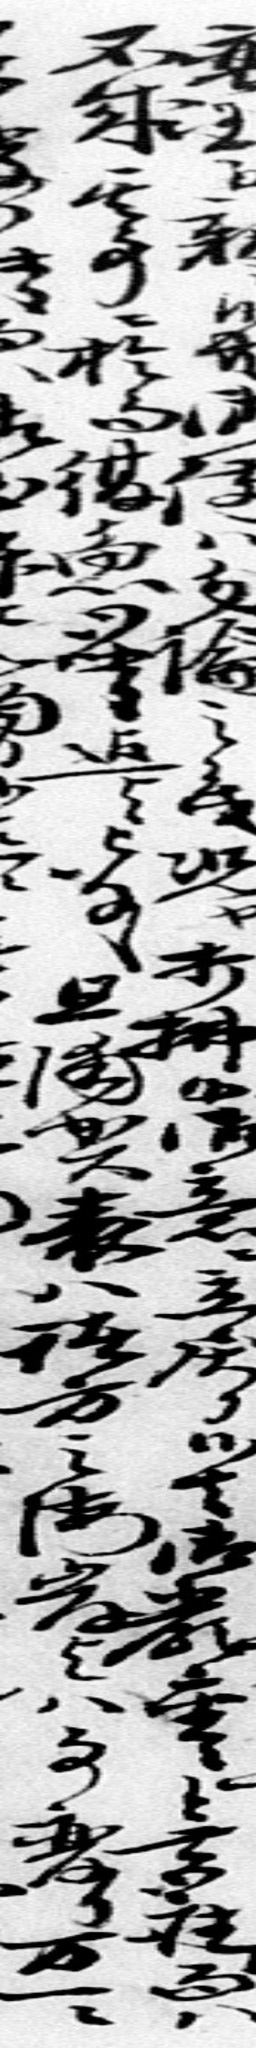不成其事に於而復興御座候迄と被存候且浦賀表は諸方之海岸とは事変り万一に
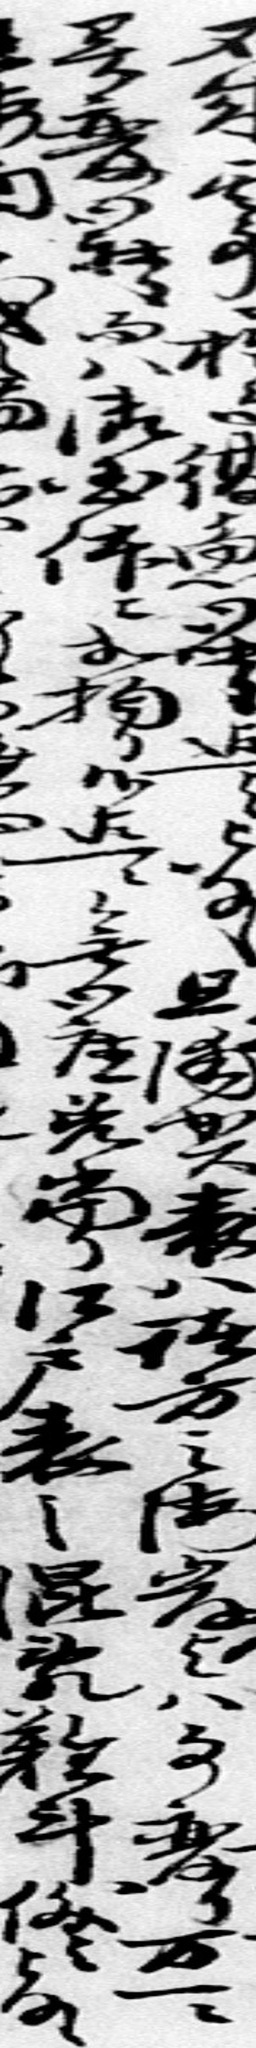異変御座候而は御国体に相拘り候迄に無御座差当り江戸表之混乱難斗儀と被存候
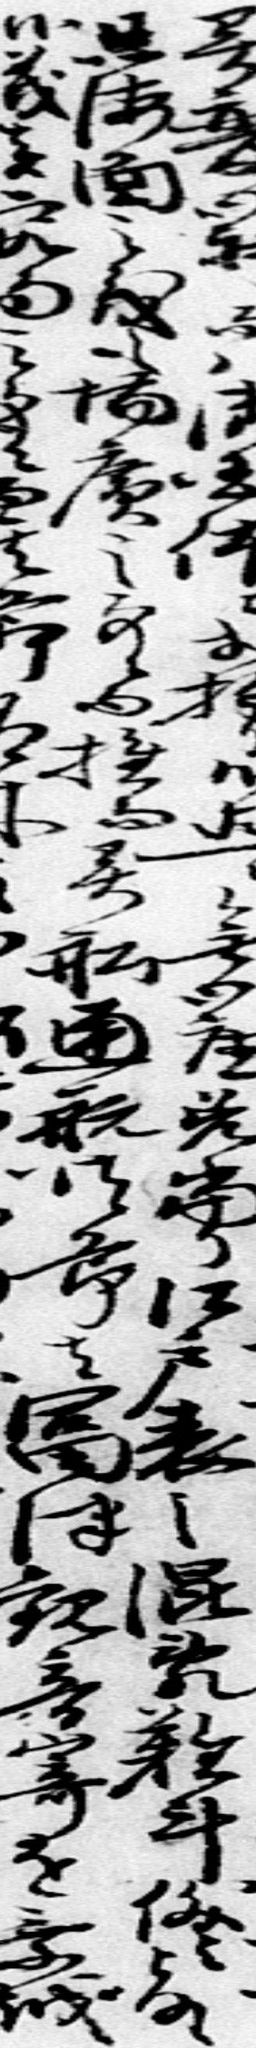御海面之義も場広之事に而推而異船通船仕候節者冨津観音崎を乗越
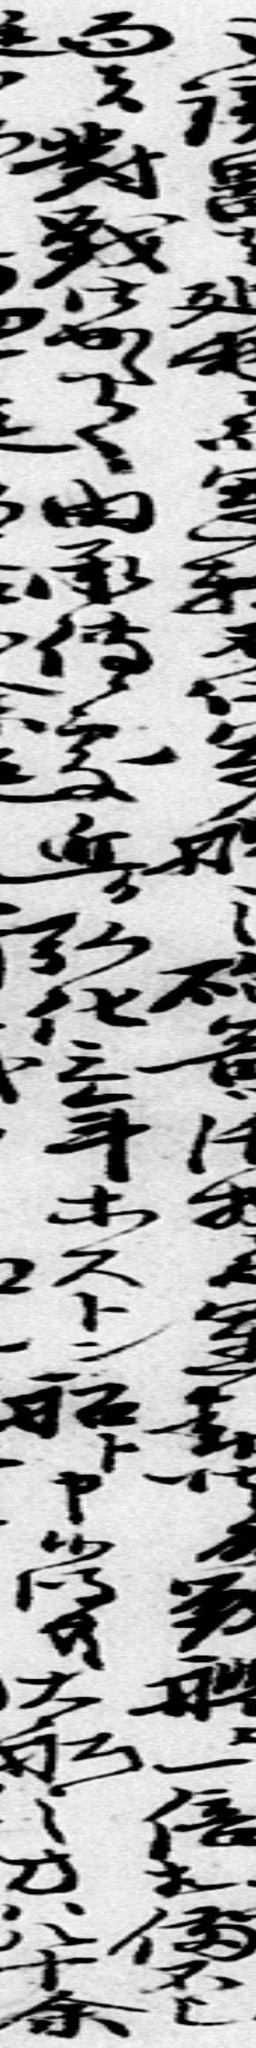而者対戦御かたく由承伝候処近く弘化三年ホストン船と申候得共大船之方は八十余
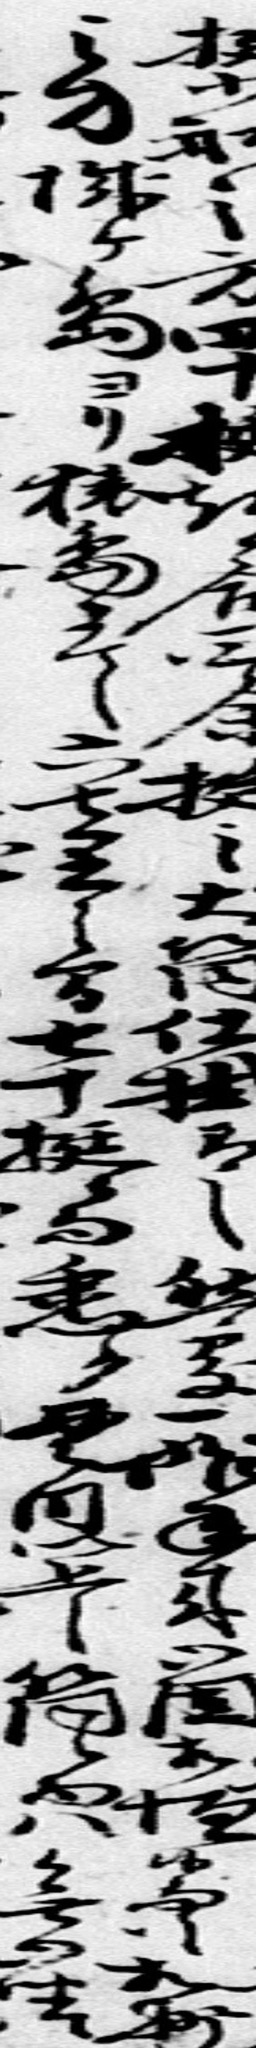之方城ヶ島より猿島まて六七里之間七十挺に而悉く貫目以上之筒に而は無御座候
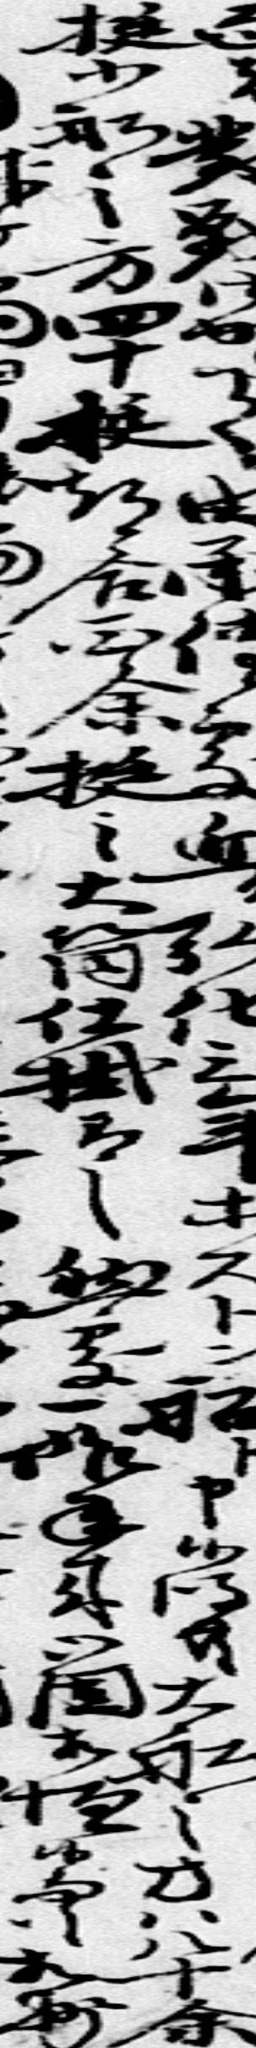挺小船之方四十挺都合百余挺之大筒仕掛有之然処一昨年来御固相増候而も相州
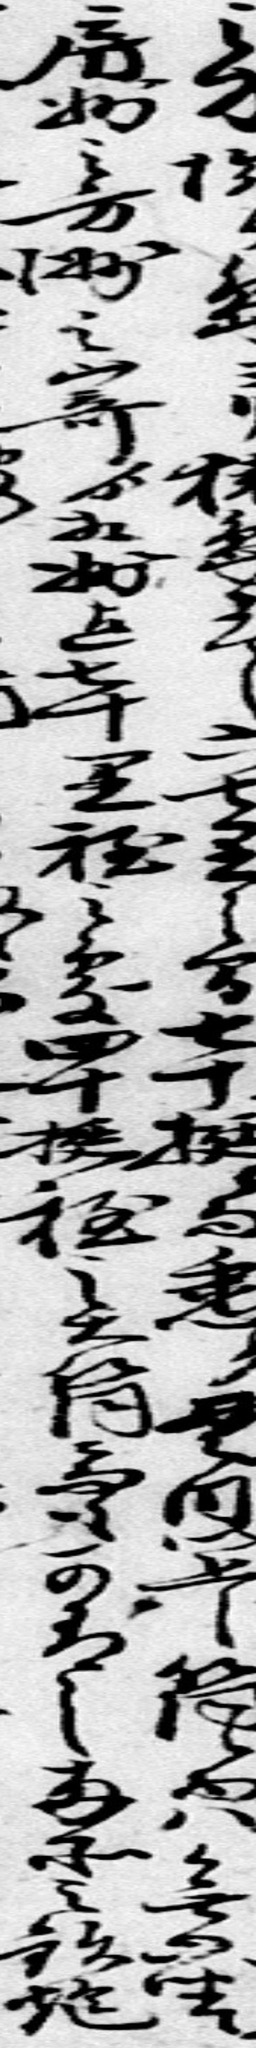房州之方洲之崎ゟ相州迄七十里程之処四十挺程之大筒に而も可有之両所之鉄砲
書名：浦賀御奉行見込秘書写
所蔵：徳島県立図書館
